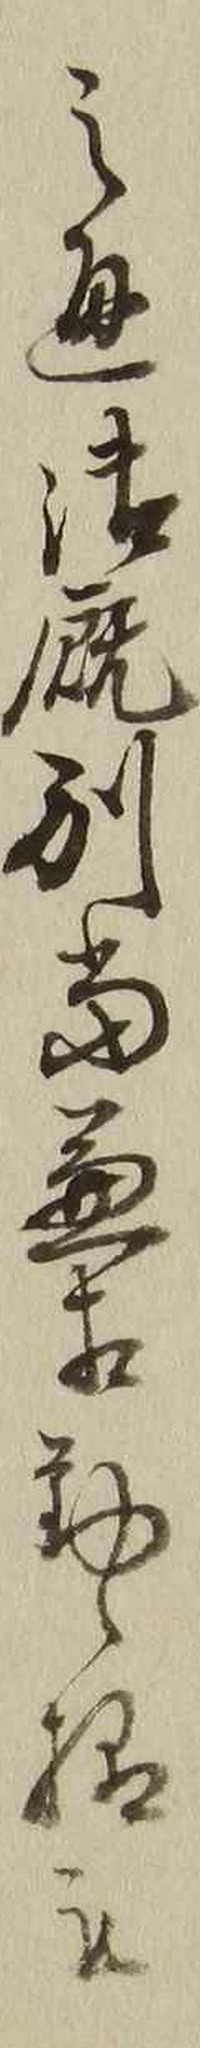之通御厩別当兼相勤候様被
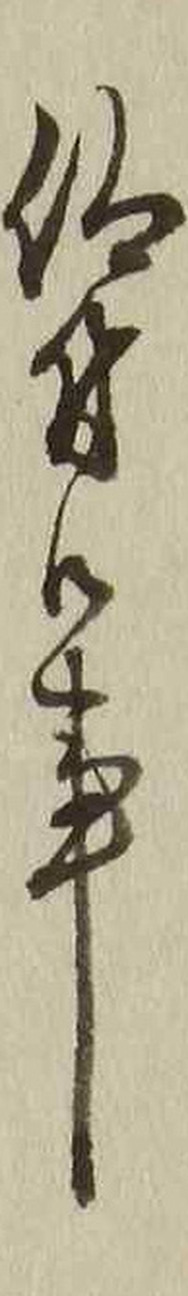仰付候事
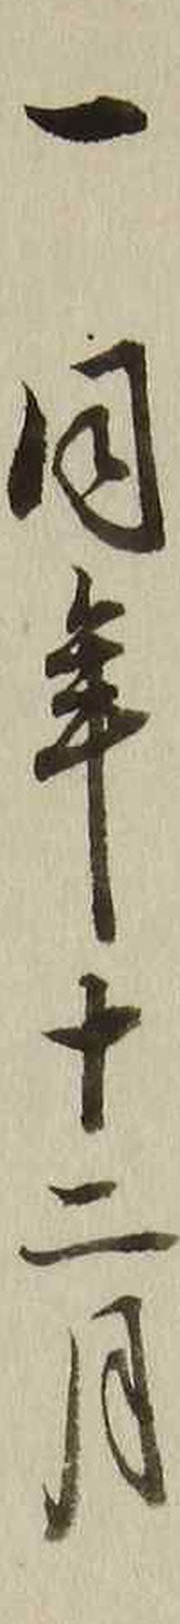一同年十二月
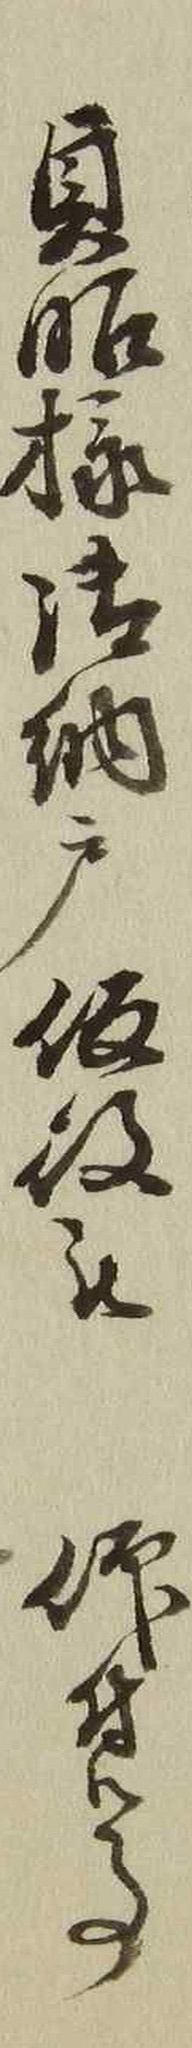貞昭様御納戸仮役被仰付候事
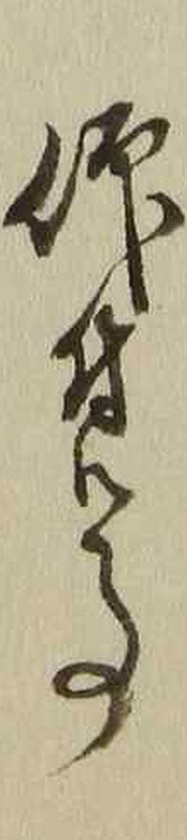仰付候事
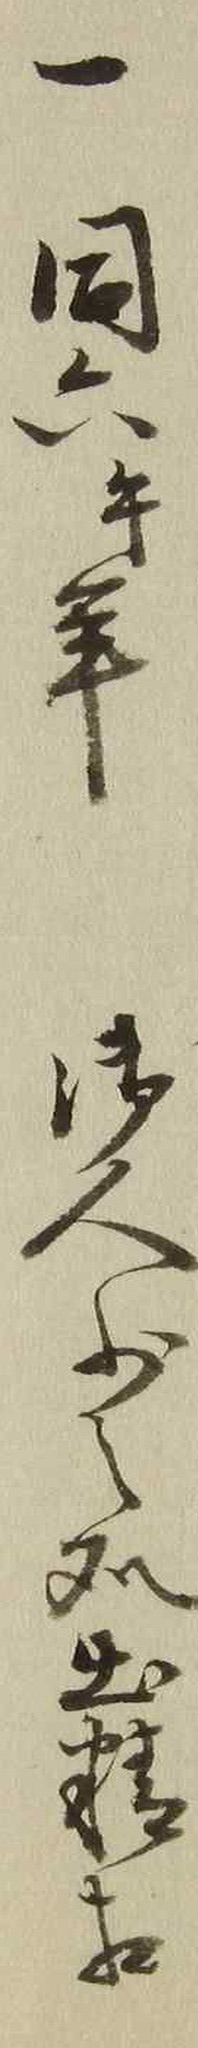一同六午年御人少之処出精相
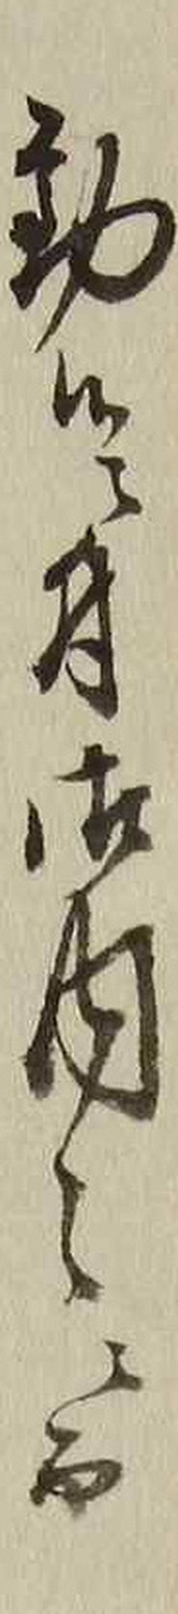勤候ニ付御内々ニ而
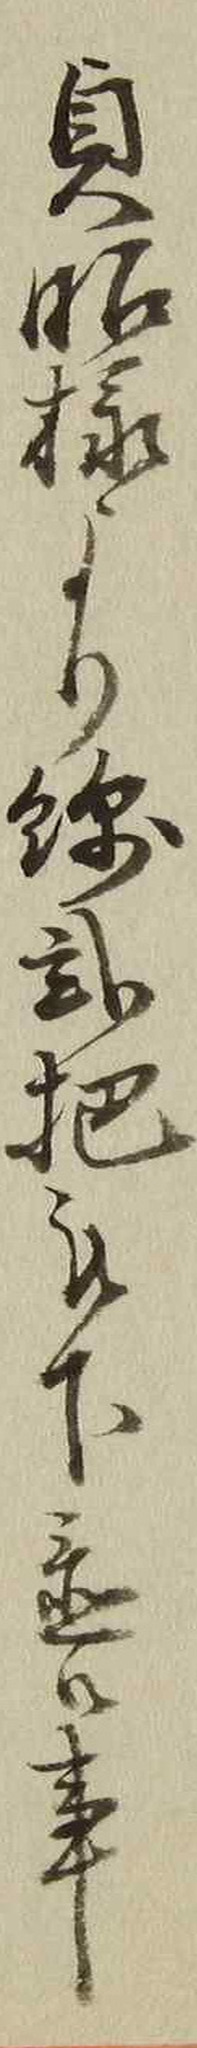貞昭様より綿弐把被下置候事
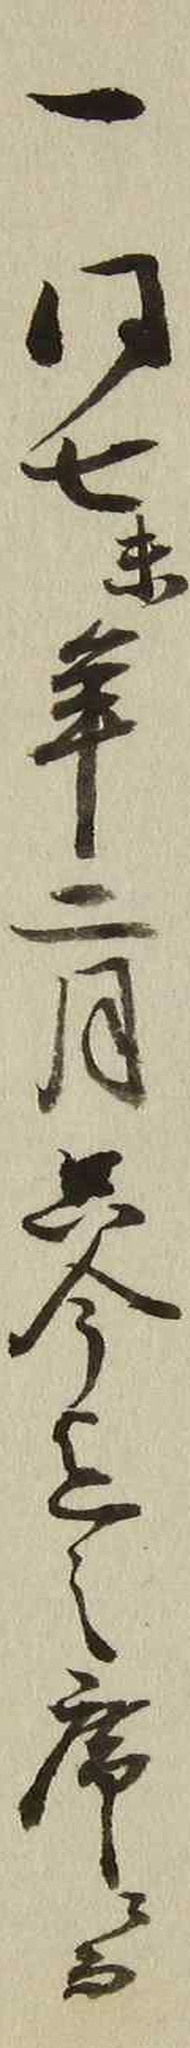一同七未年二月只今迄之席ニ而
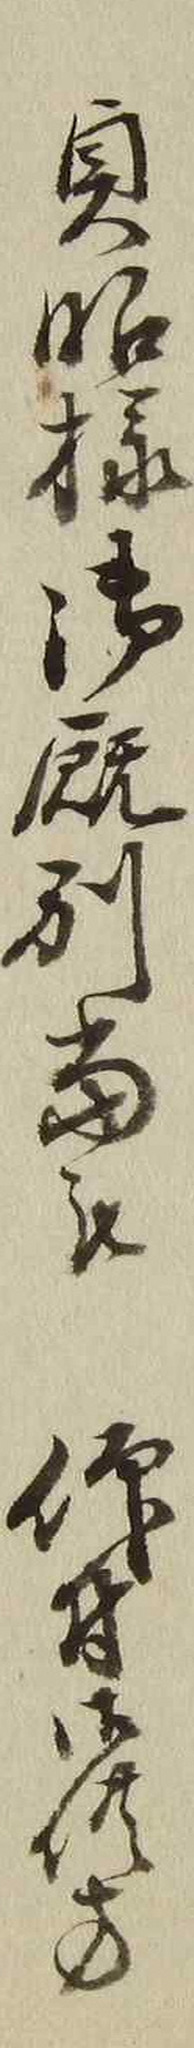貞昭院様御厩別当被仰付御供方
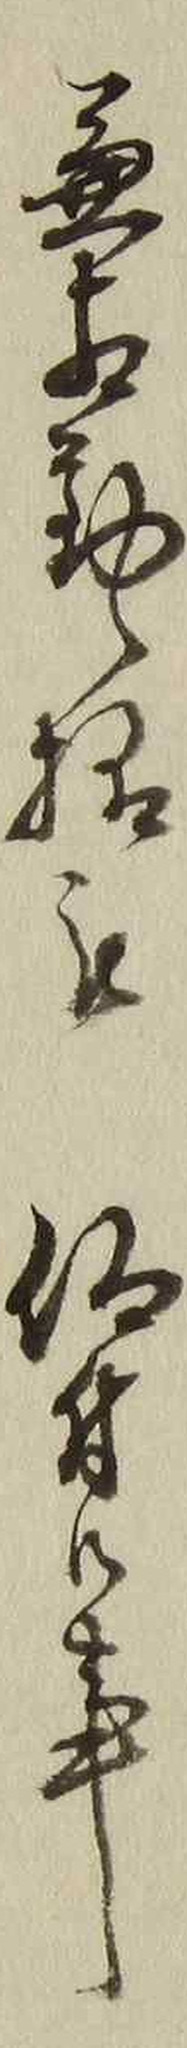兼相勤候様被仰付候事
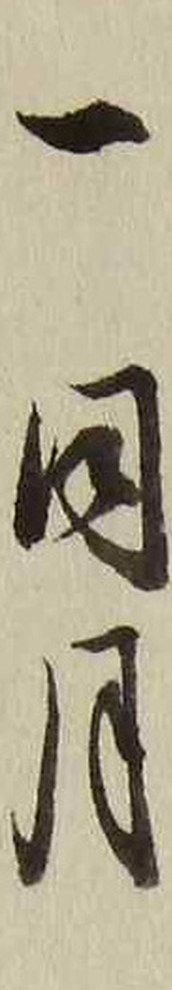一同月
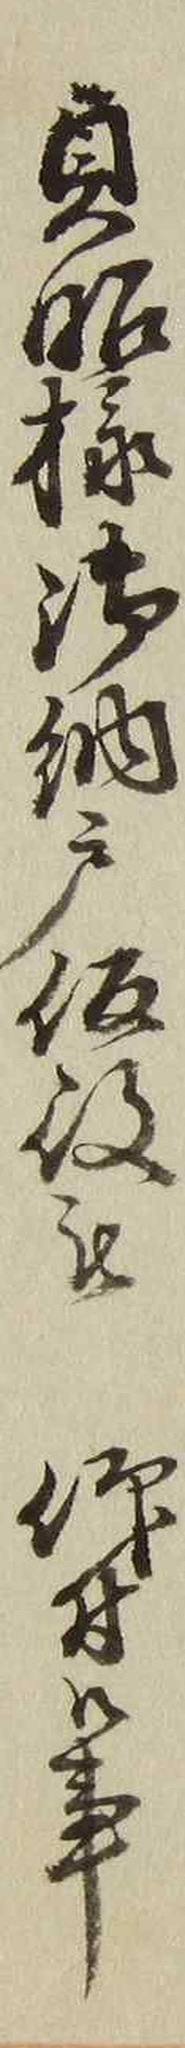貞昭様御納戸仮役被仰付候事
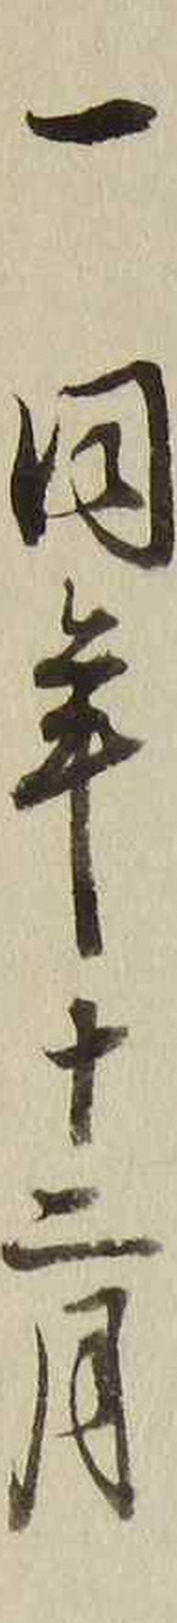一同年十二月
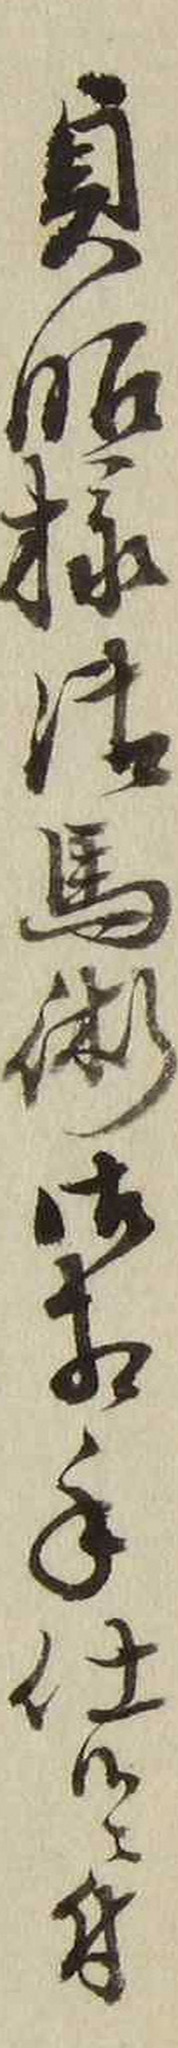貞昭院様御馬術御相手仕候ニ付
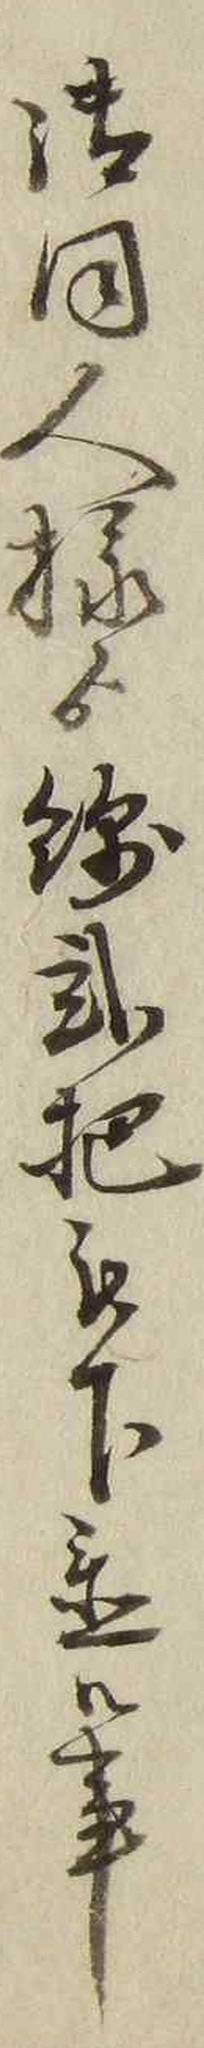御同人様ゟ綿弐把被下置候事
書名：諸士系譜　巻之31　い之部31
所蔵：会津若松市立会津図書館
